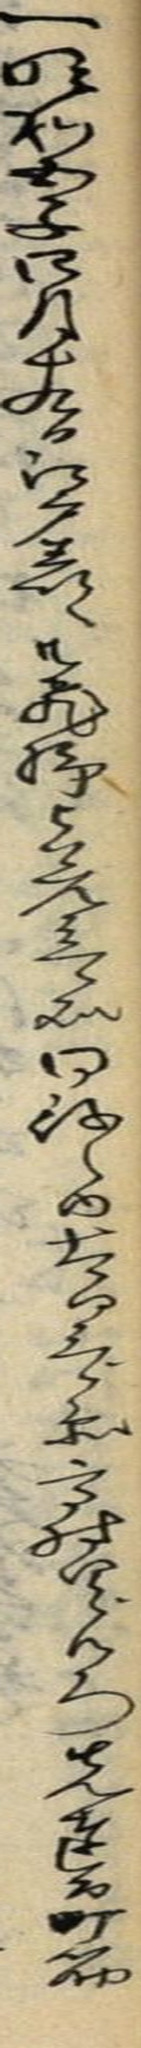一明和五子四月十九日江戸表へ御飛脚被差立候処同役之内太田三郎兵衛髙村四郎右衛門先達而町筋
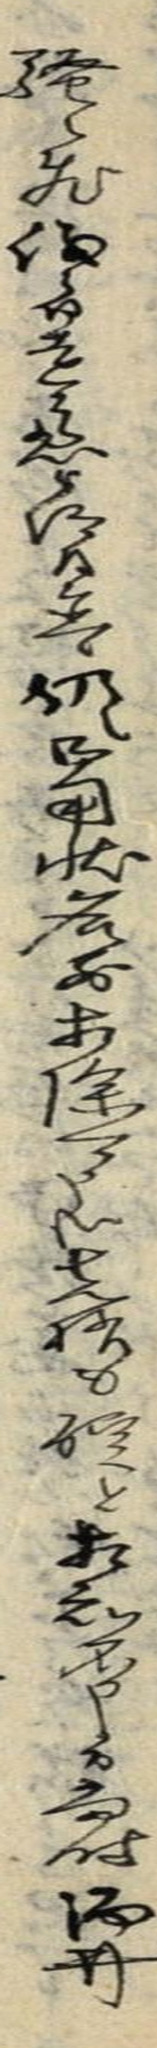騒々敷儀に付遠慮被仰付置候仍之御用状名前相除可申候哉先格も聢と承知不申に付当時酒井
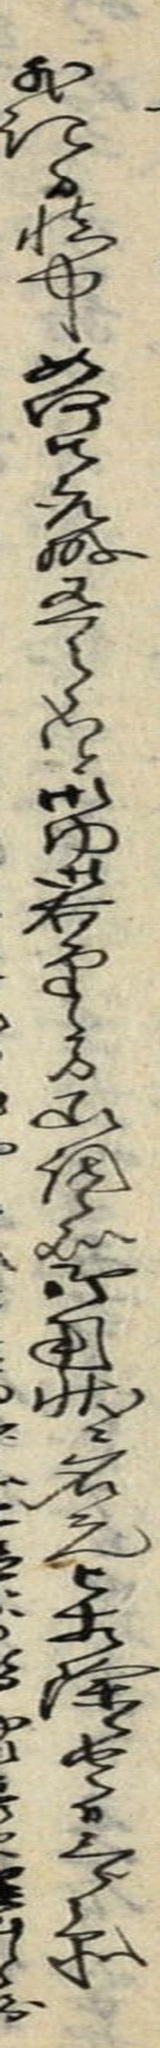外記方慎中如何御取扱有之候哉と御内御右筆方承調候処御用状に名元被相除候由候付三郎兵衛
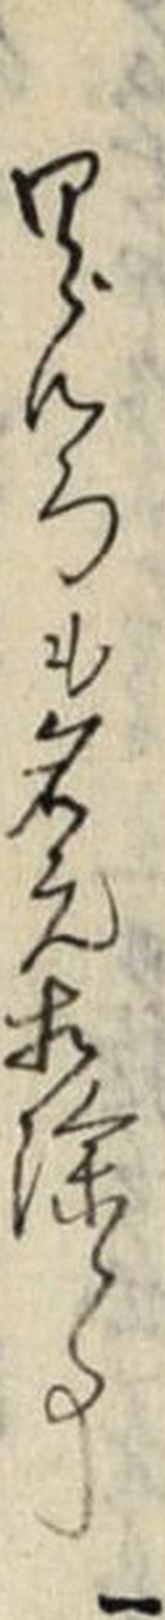四郎右衛門も名元相除候事
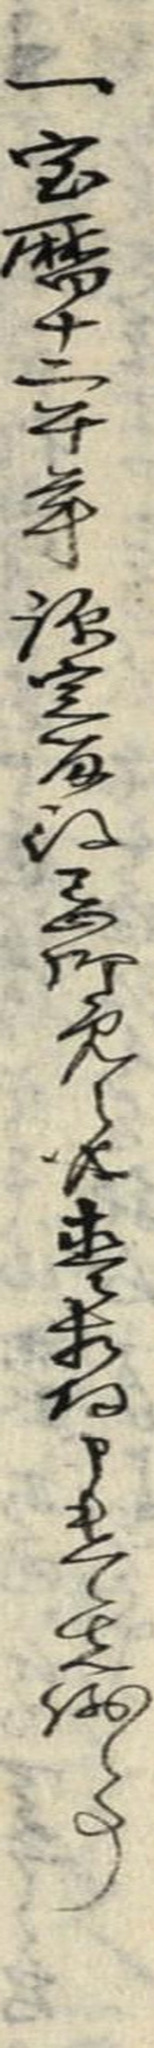一宝暦十二午年評定留役忌御免之儀直々相伺申遣候先例之事
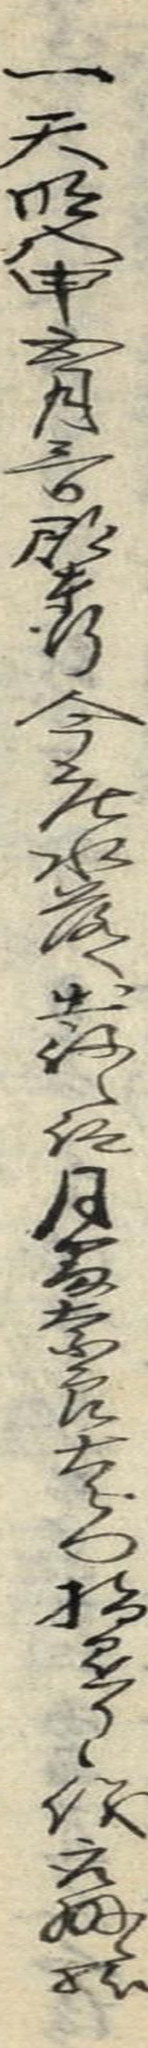一天明八申五月三日郡奉行今庄水落へ出役之跡跡月番奈良太郎右衛門指懸り候儀取扱候様
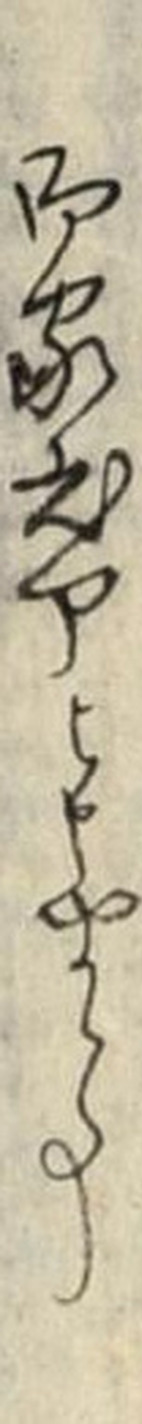御家老中被申聞候事
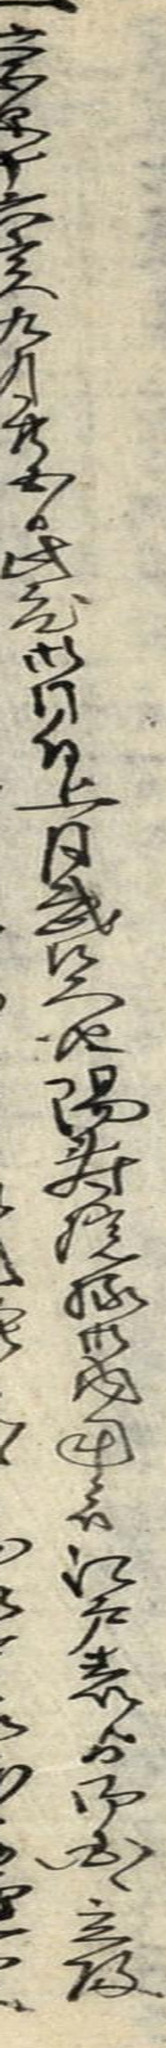一享保十六亥九月廿五日此度御目付上月武左衛門儀陽寿院様御内用に付江戸表ゟ御国へ立帰
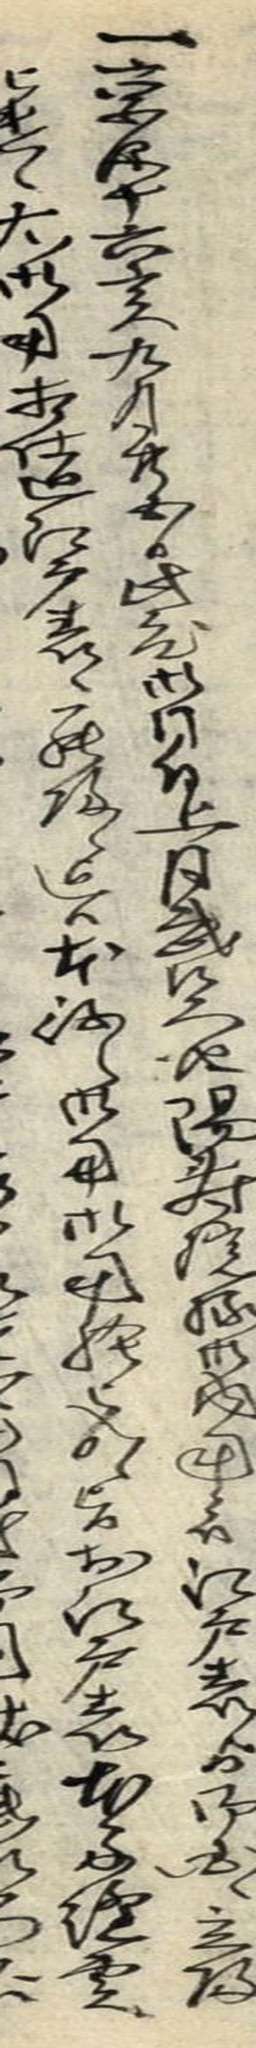被遣候右御用相仕廻江戸表へ罷帰候迄は本役之御用御用捨被成候旨於江戸表本多縫殿
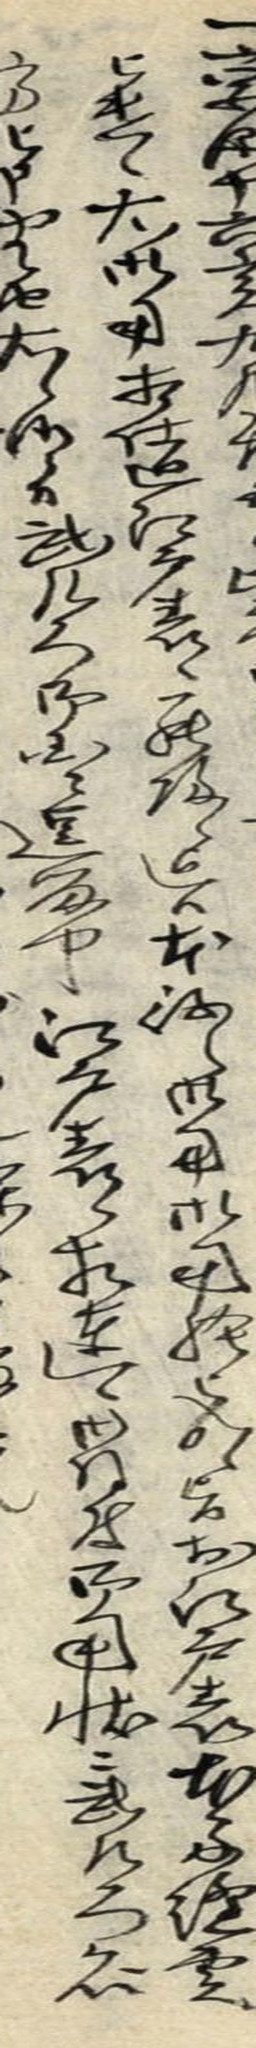方被申聞候由右之儀に付武左衛門御国に逗留中江戸表へ相達候御目付御用状に武左衛門名
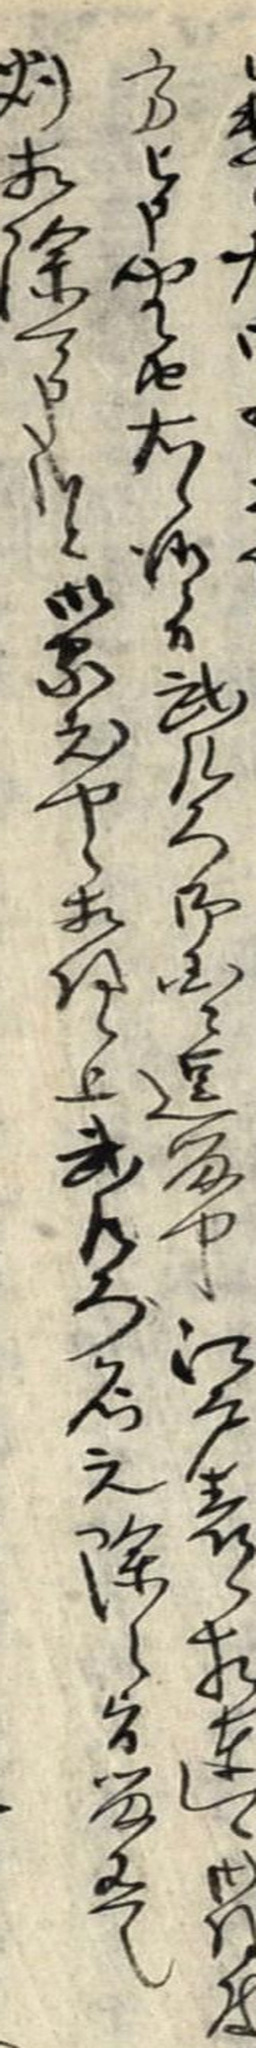判相除可申哉と御家老中へ相伺候上武左衛門名元除之旨留有之
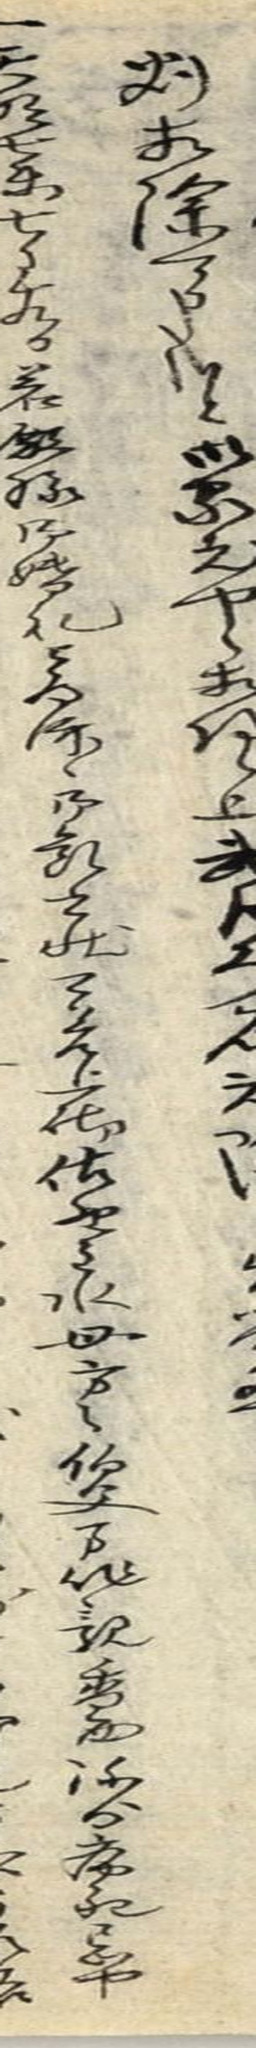一天明七未七月十九日若殿様御婚礼被為済候御歓書状可差上砌佐野主水母方之伯父万作之親香西弥右衛門病死忌中
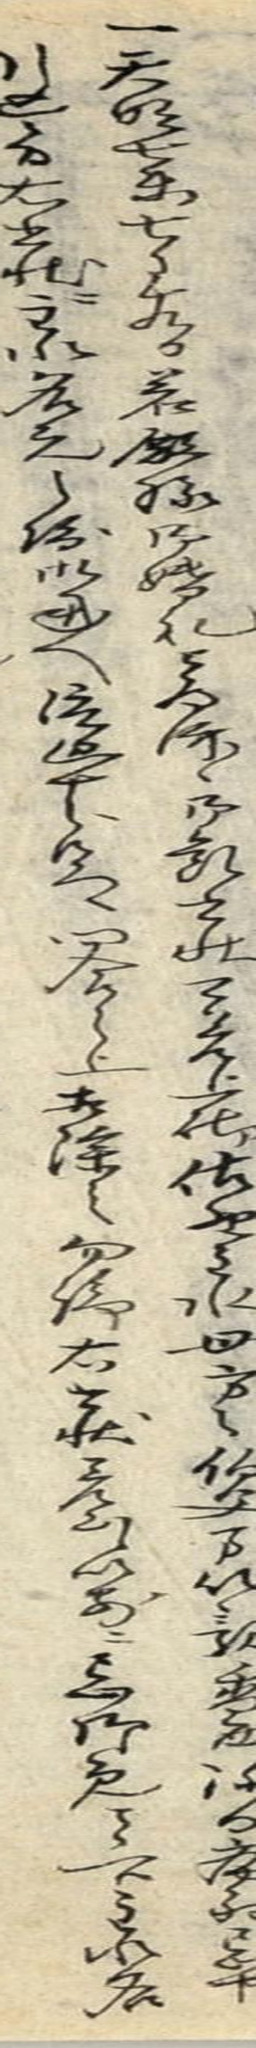引込に付右書状に主水名元之儀御用人渡辺十郎左衛門へ問合之上相除之勿論右書状差出候以前忌御免に候へは主水名
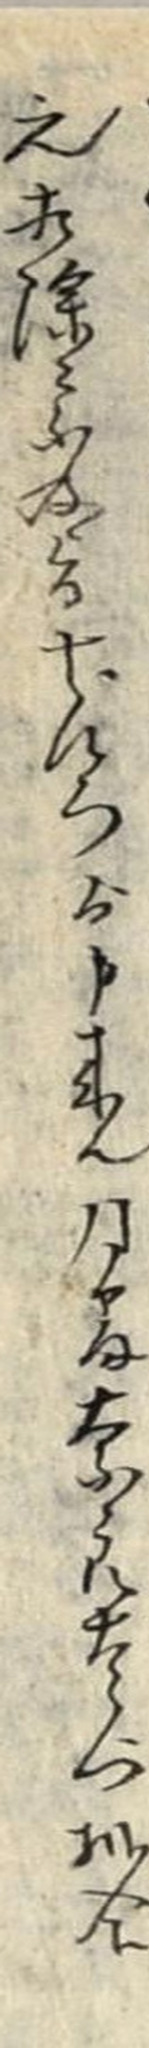元相除に不及旨十郎左衛門ゟ申来る月番奈良太郎右衛門掛合

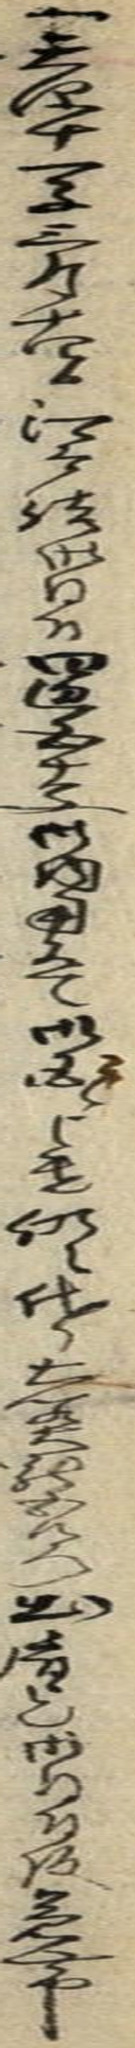一天保十一子三月十四日江戸詰御目付田辺五太夫御内用有之御国へ申遣仍之代り大関新五左衛門出府迄御目付役兼帯
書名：蒐輯之部
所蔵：福井県文書館 Fukui Prefectural Archives
